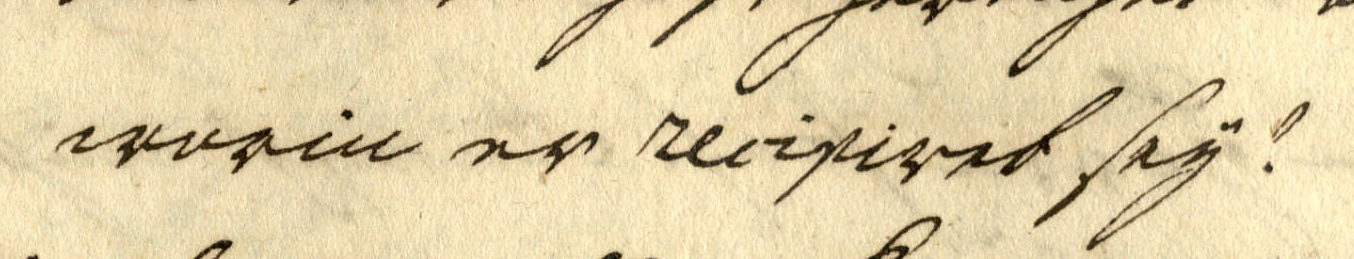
worin er recipiret sey?
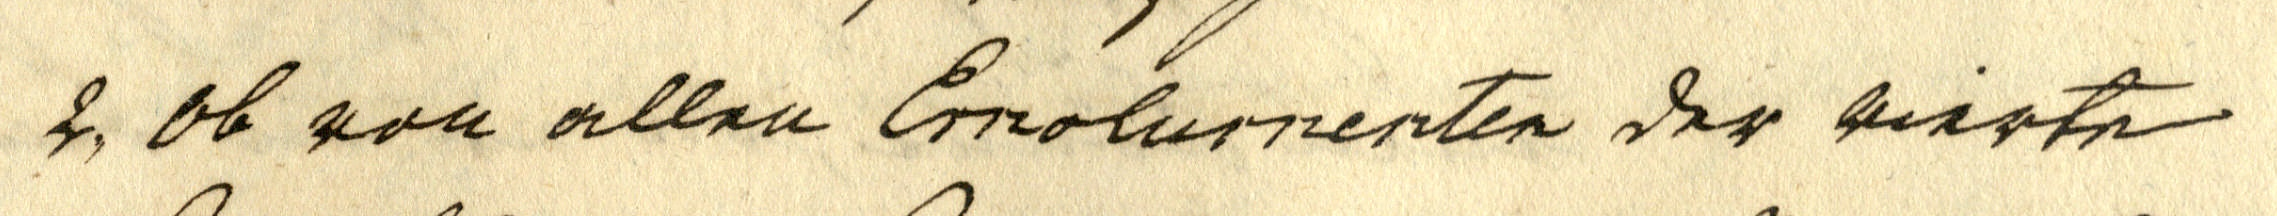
2. Ob von allen Emolumenten der vierte
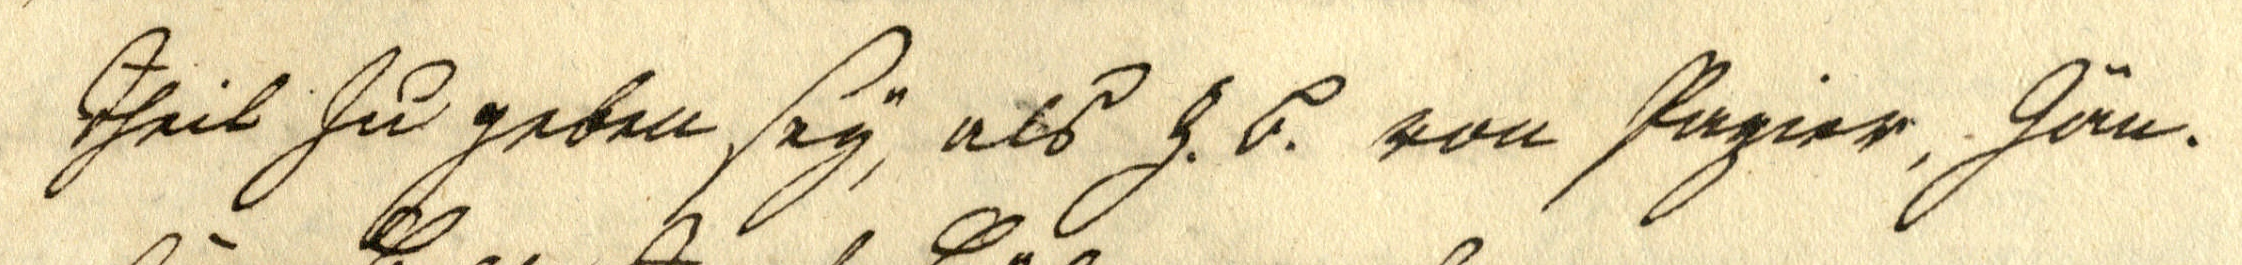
Theil zu geben seÿ, als z. B. von Papier, Gän¬
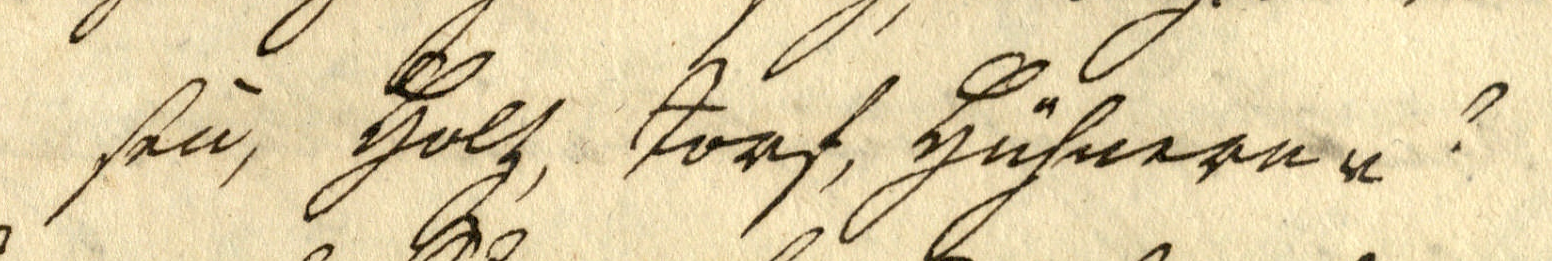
sen, Holz, Torf, Hühnern v?
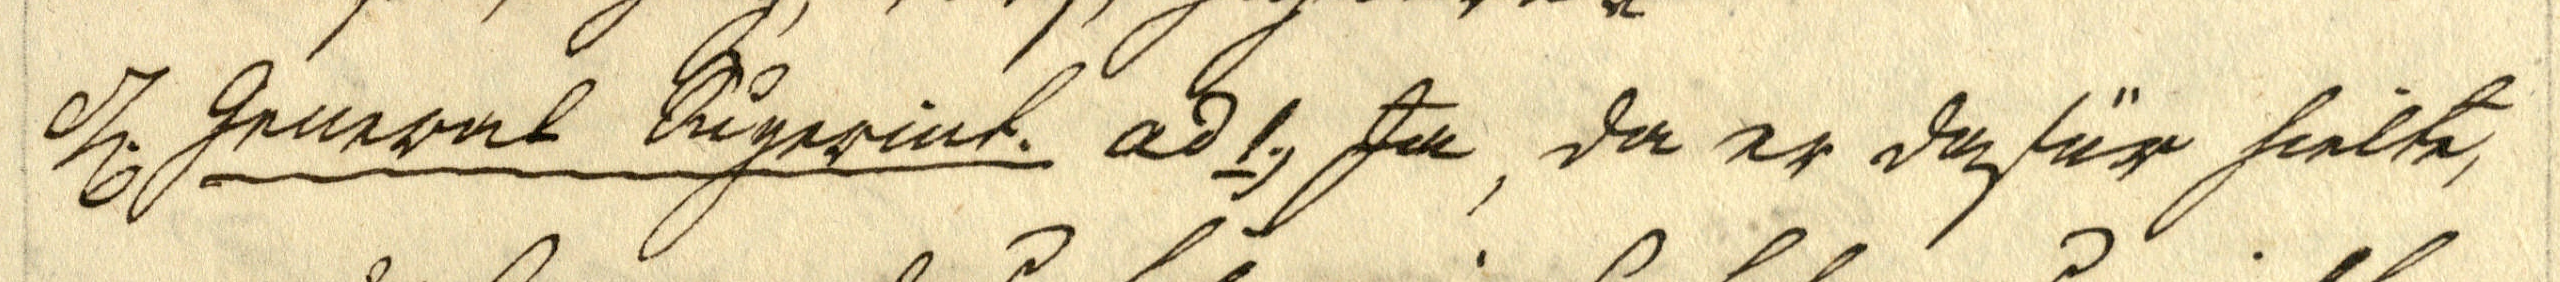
dh. General Superint. ad 1, Ja, da er dafür hielte,
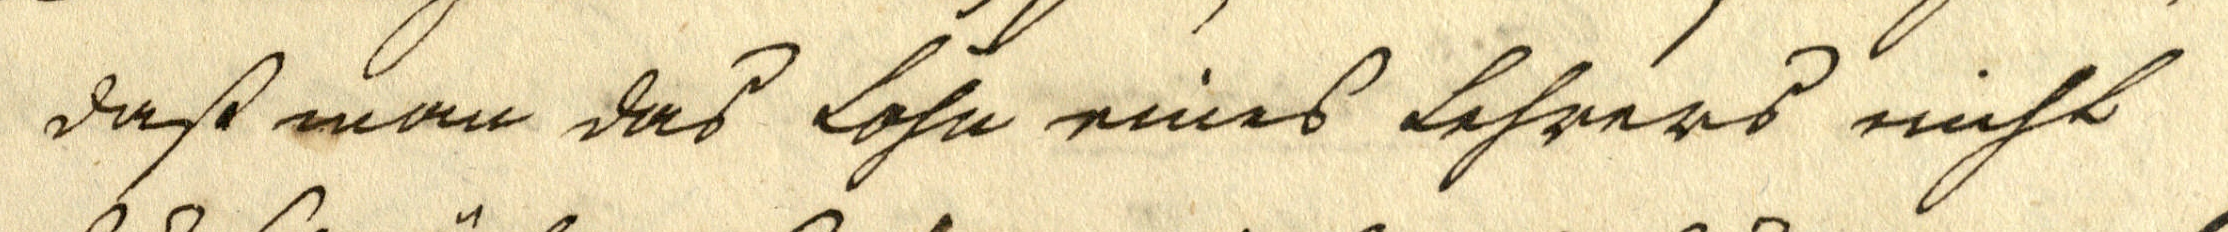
daß man das Lohn eines Lehrers nicht
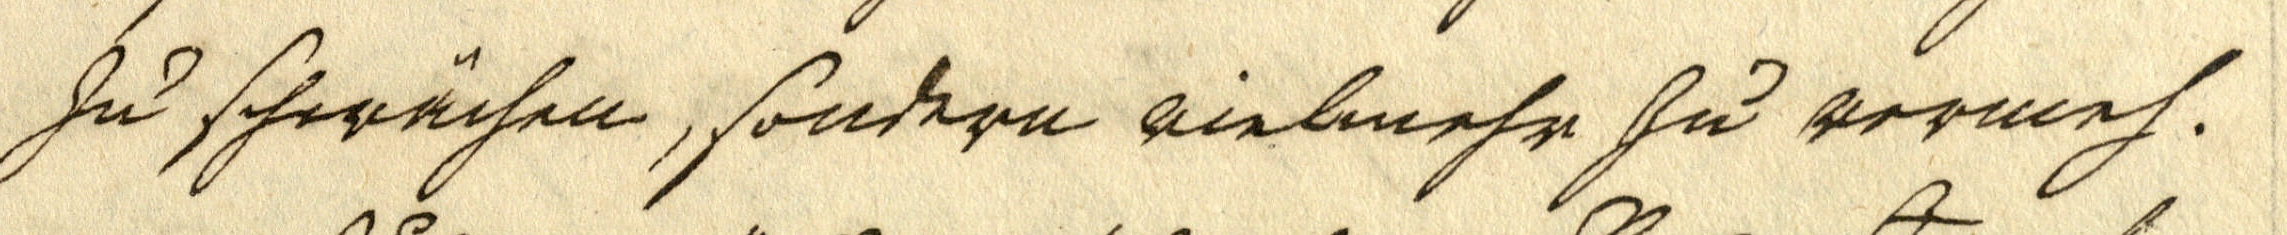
zu schwächen, sondern vielmehr zu vermeh¬
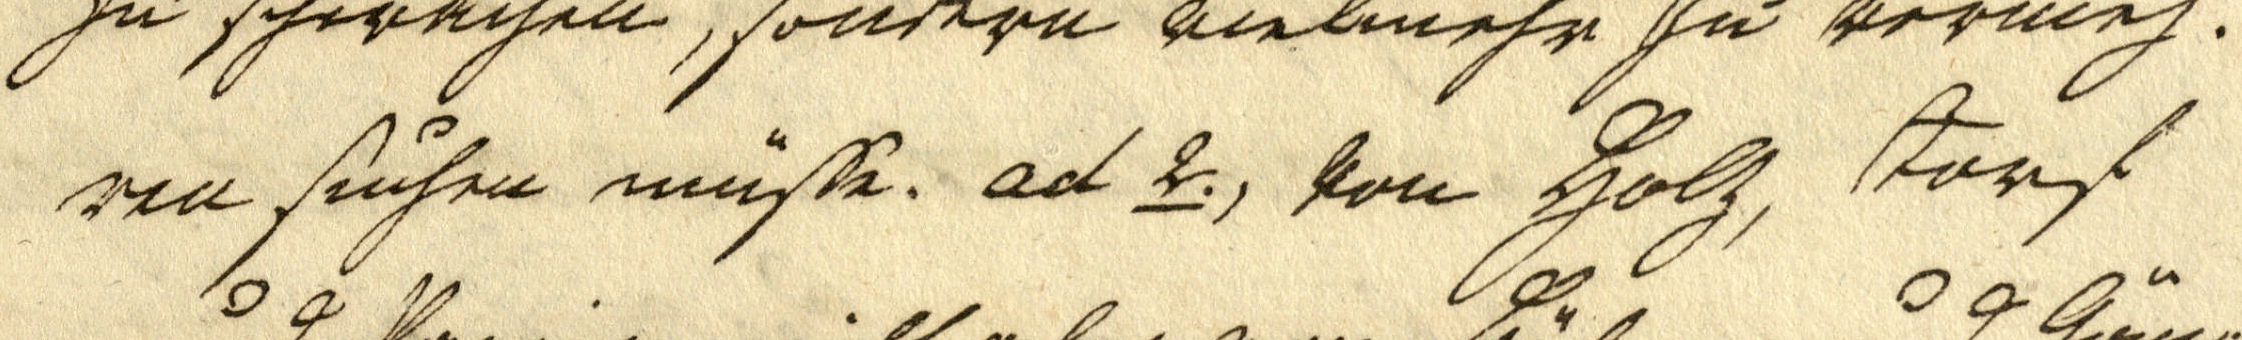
ren suchen müsse. ad 2., von Holz, Torf
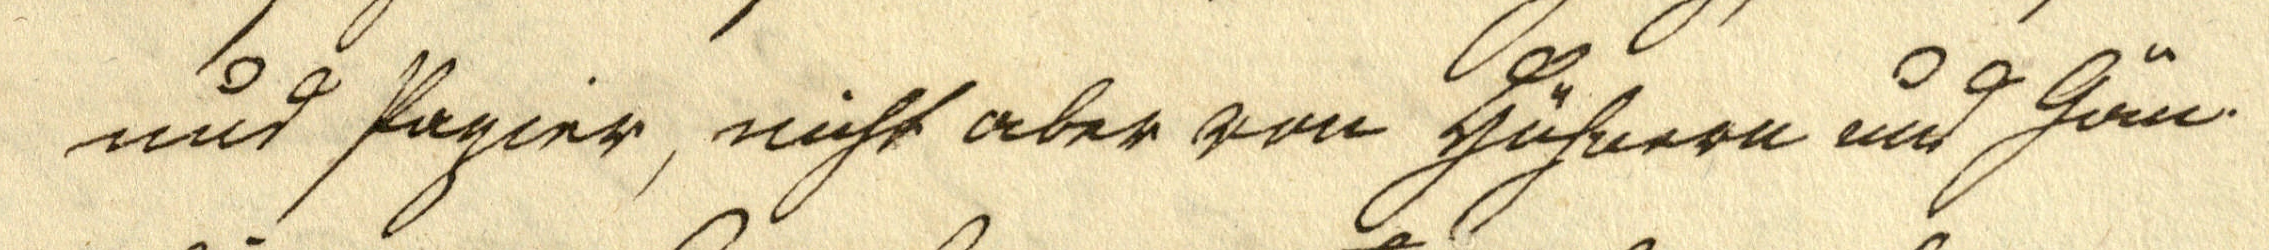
und Papier, nicht aber von Hühnern und Gän¬
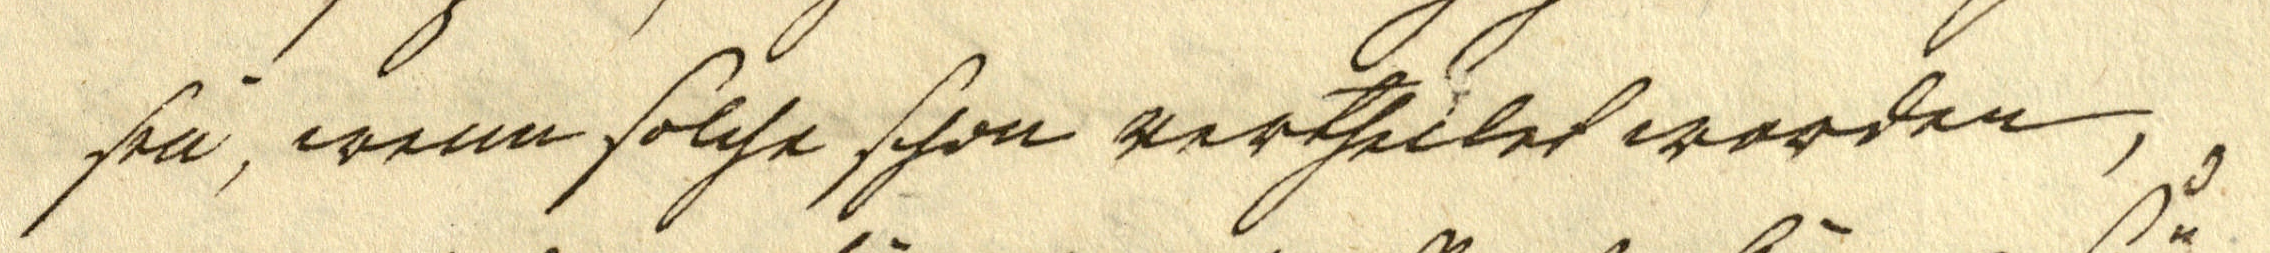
sen, wenn solche schon vertheilet worden,
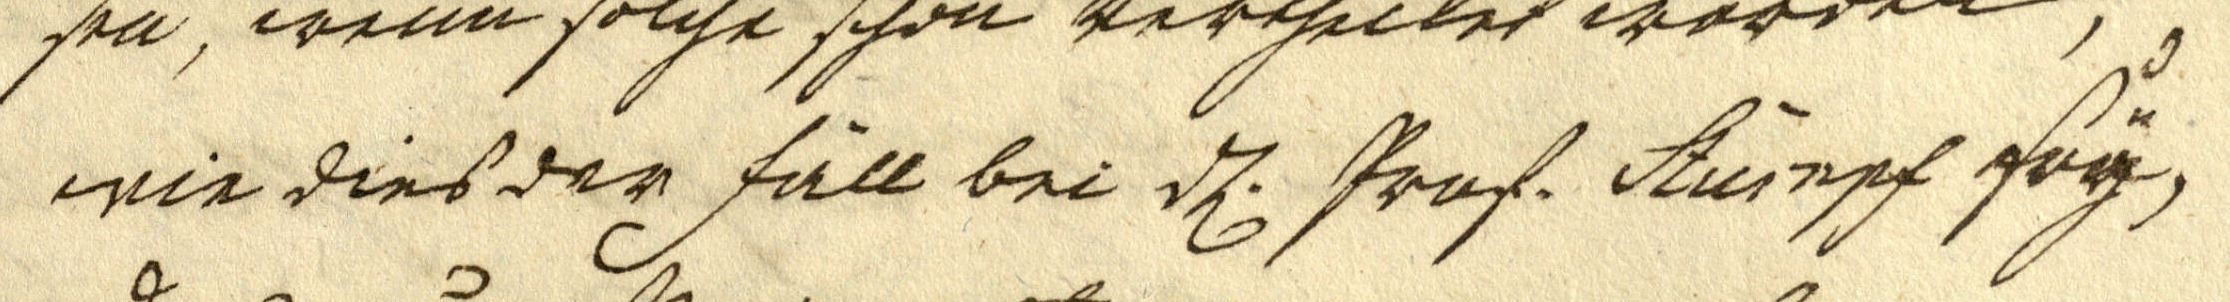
wie dies der Fall bei dh. Prof. Stumpf seÿ,
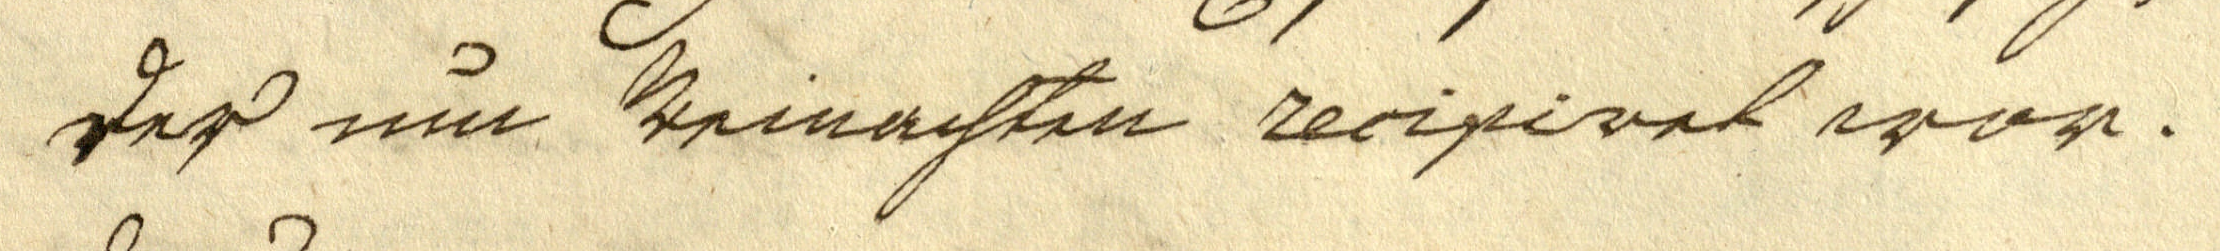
der um Weinachten recipiret wor¬
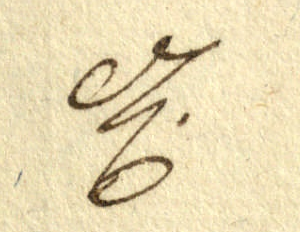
dh.
